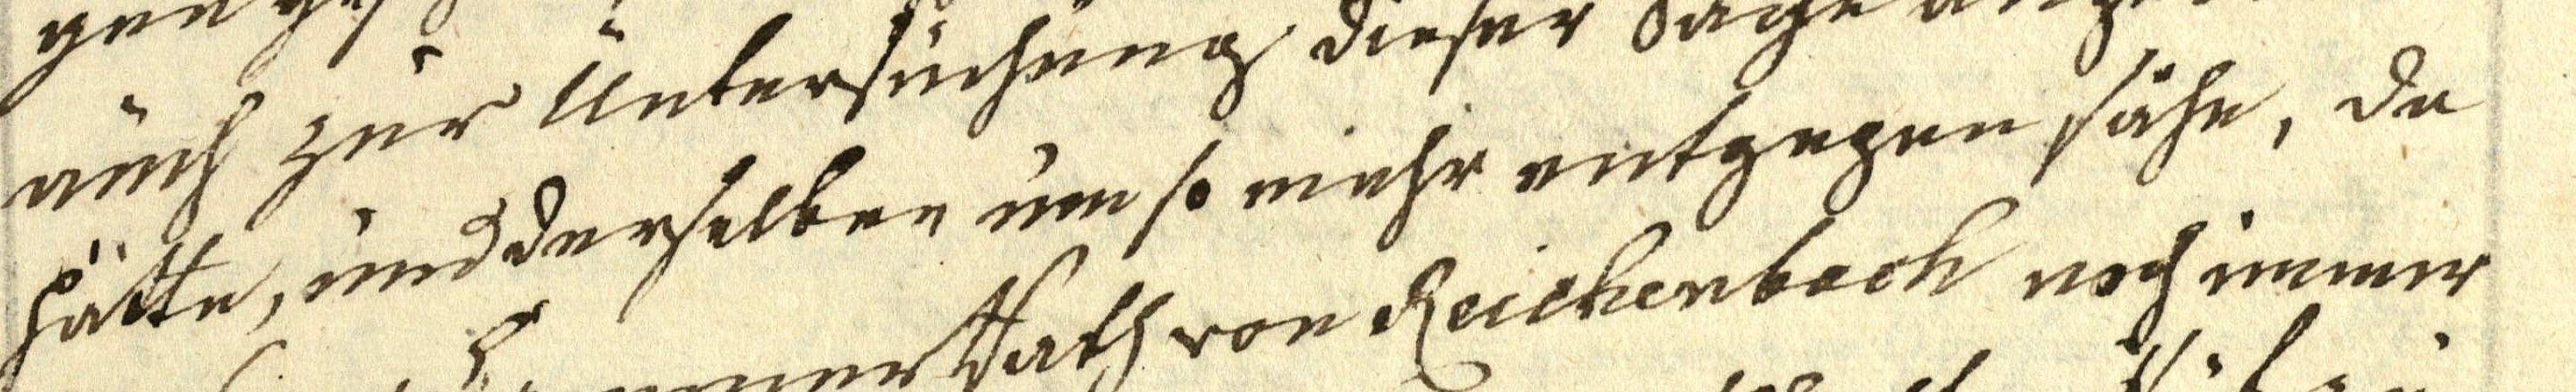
hätte, und derselben um so mehr entgegen sähe, da
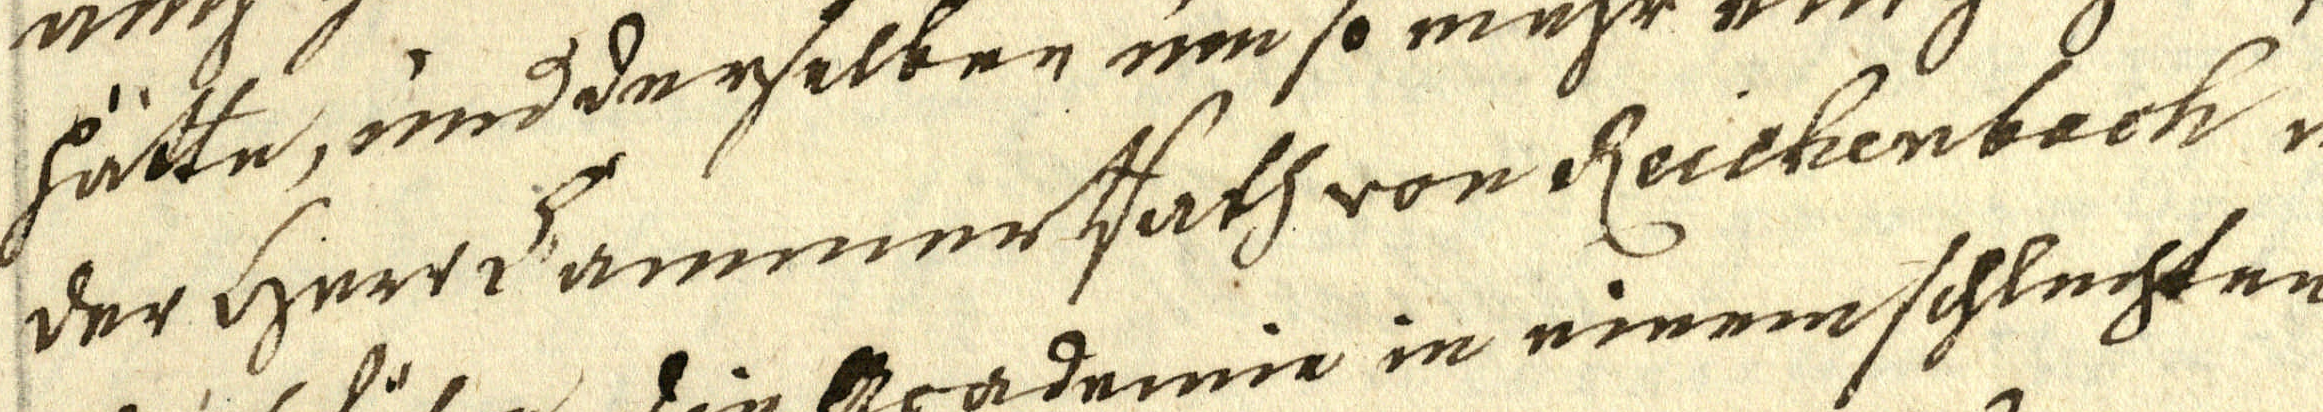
der Herr CammerRath von Reichenbach noch immer
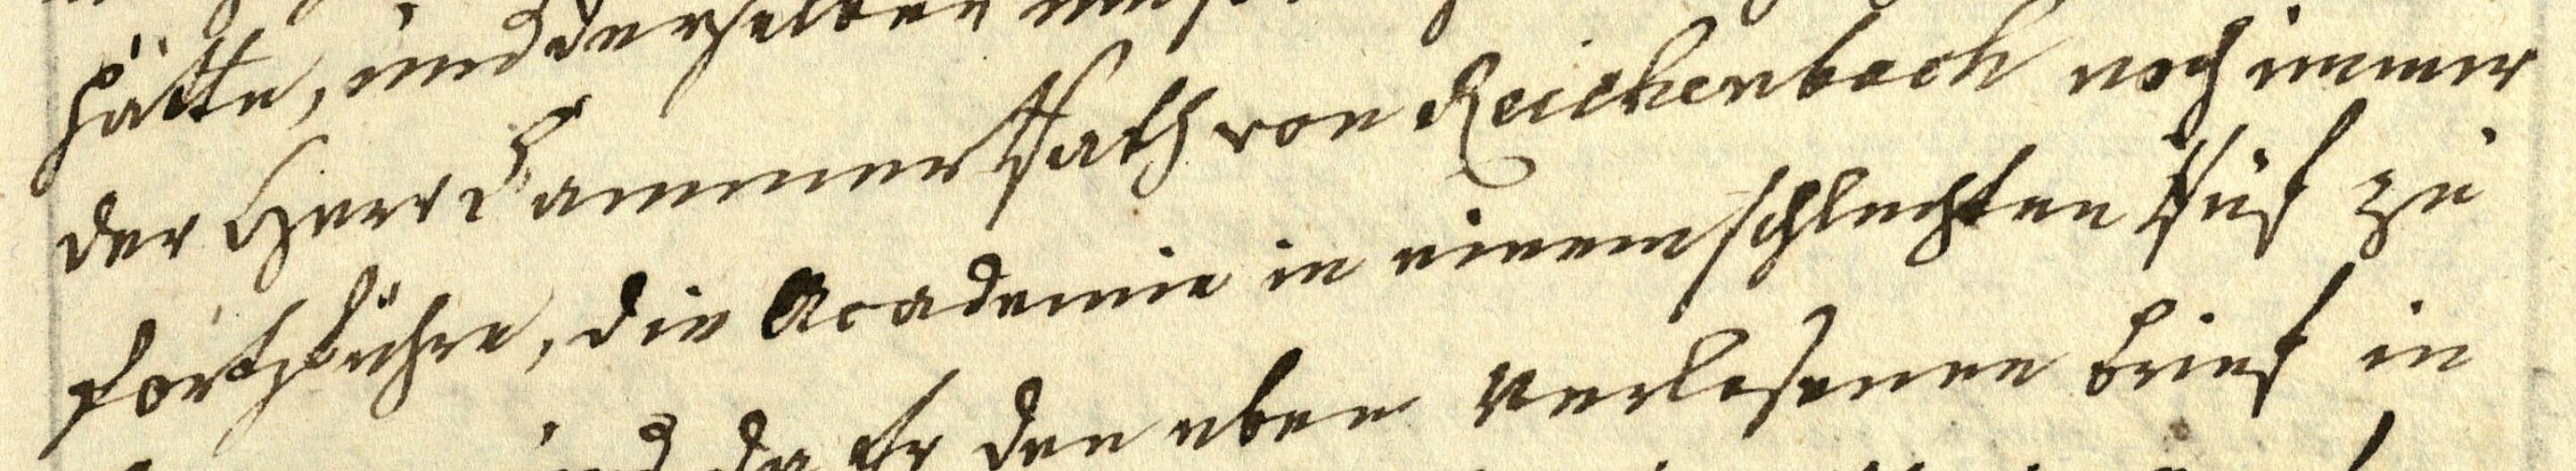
fortführe, die Academie in einem schlechten Ruf zu
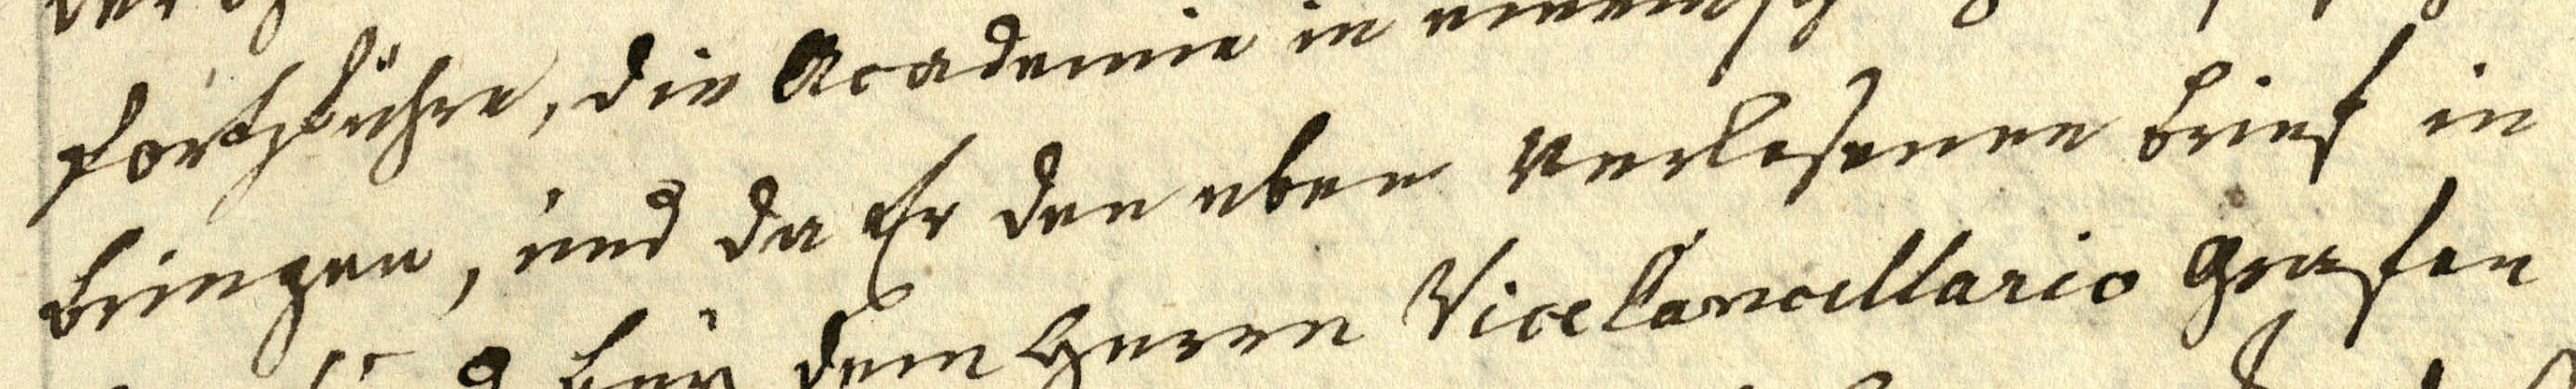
bringen, und da Er den eben verlesenen Brief in
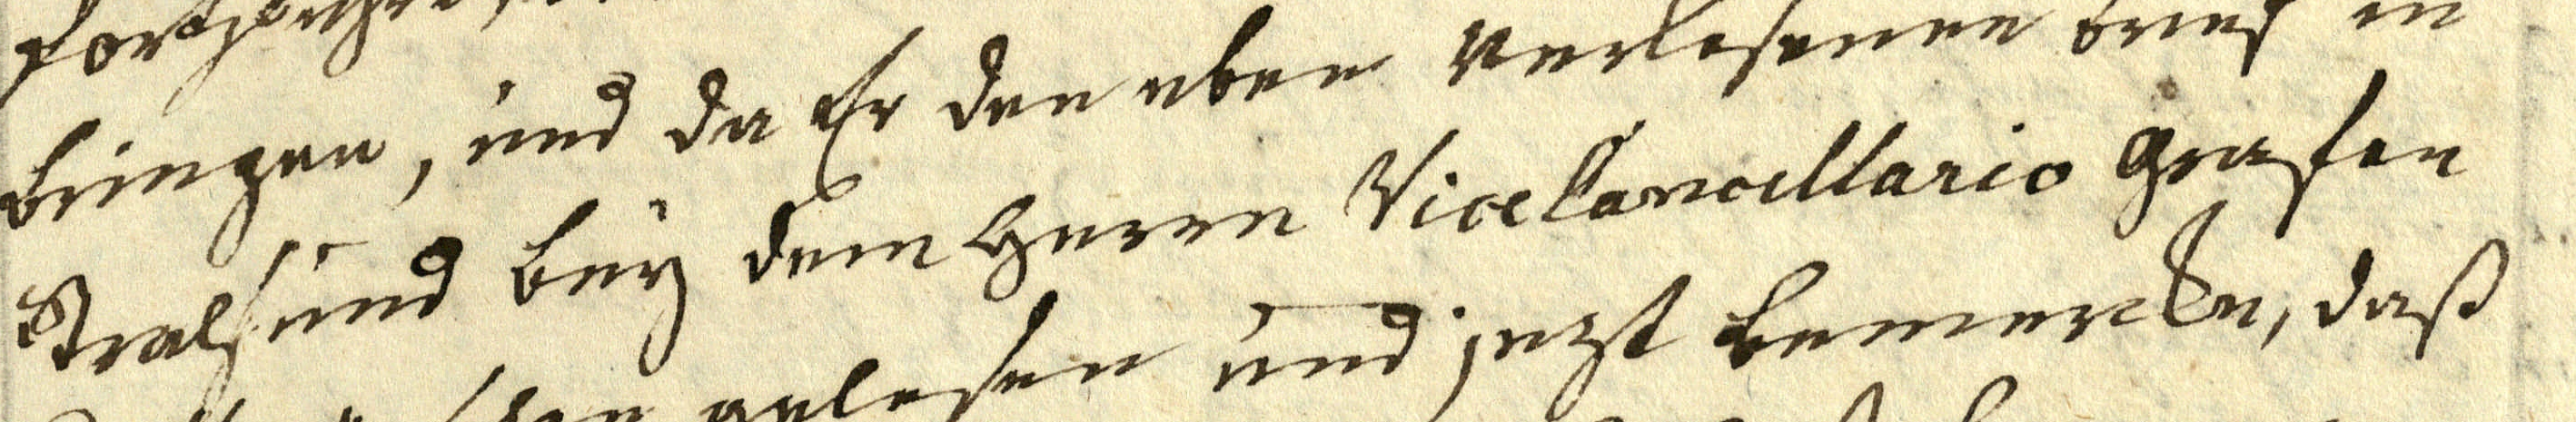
Stralsund beÿ dem Herrn Vice Cancellario Grafen
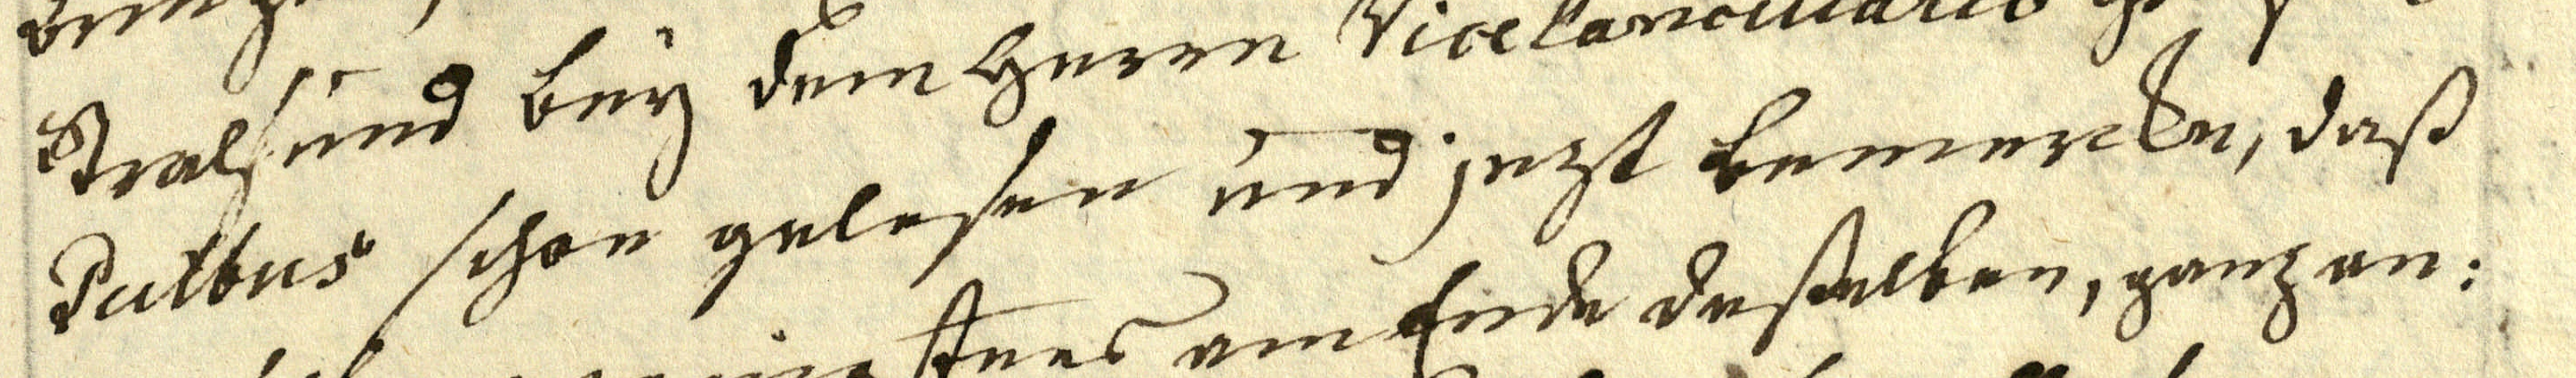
Putbus schon gelesen und jezt bemercke, daß
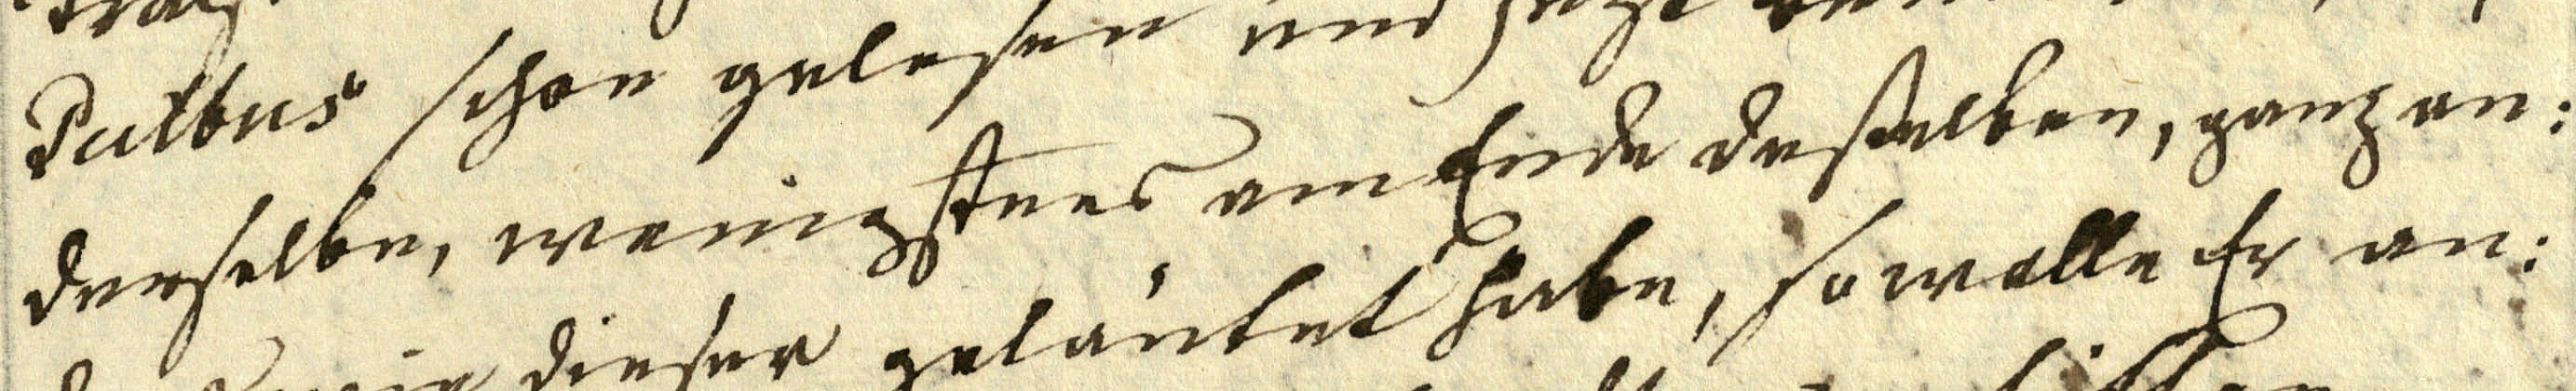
derselbe, wenigstens am Ende deßelben, ganz an¬
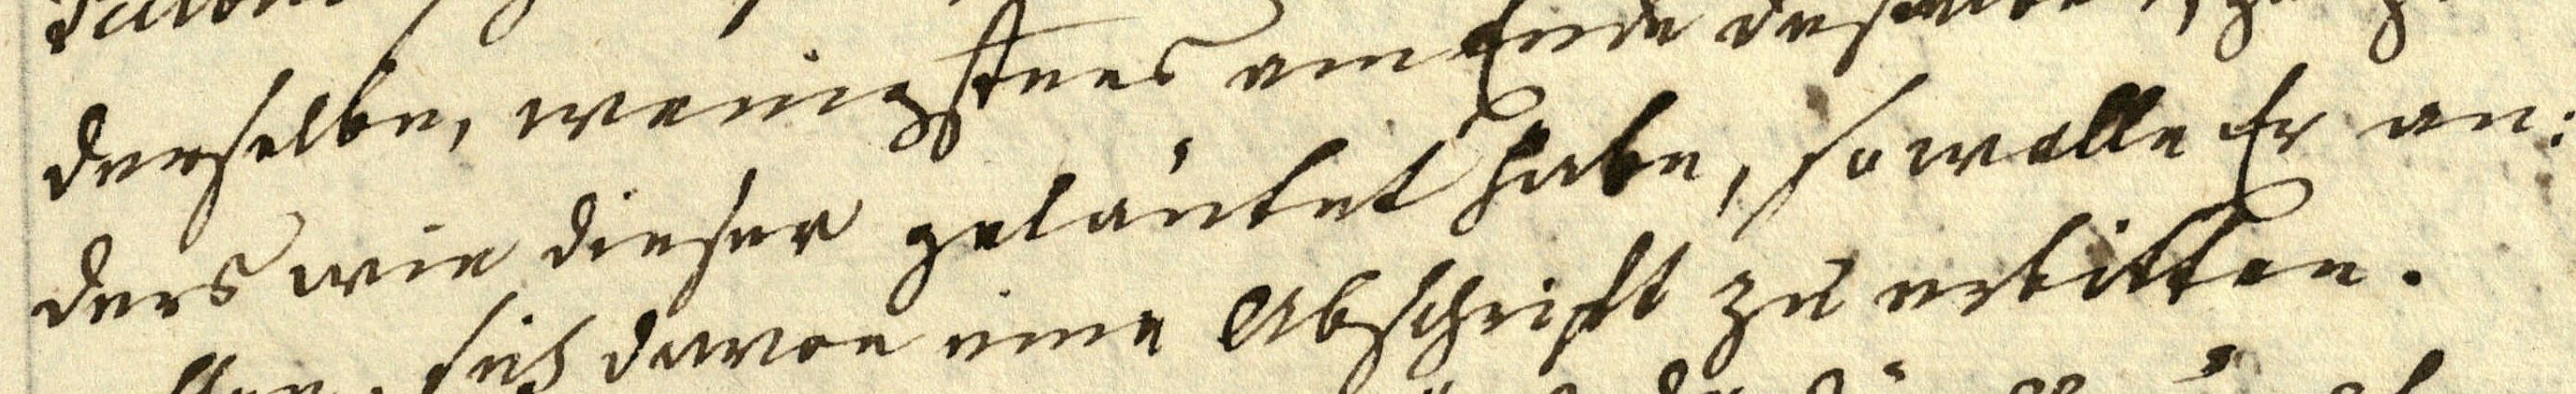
ders wie dieser gelautet habe, so wolle Er an¬
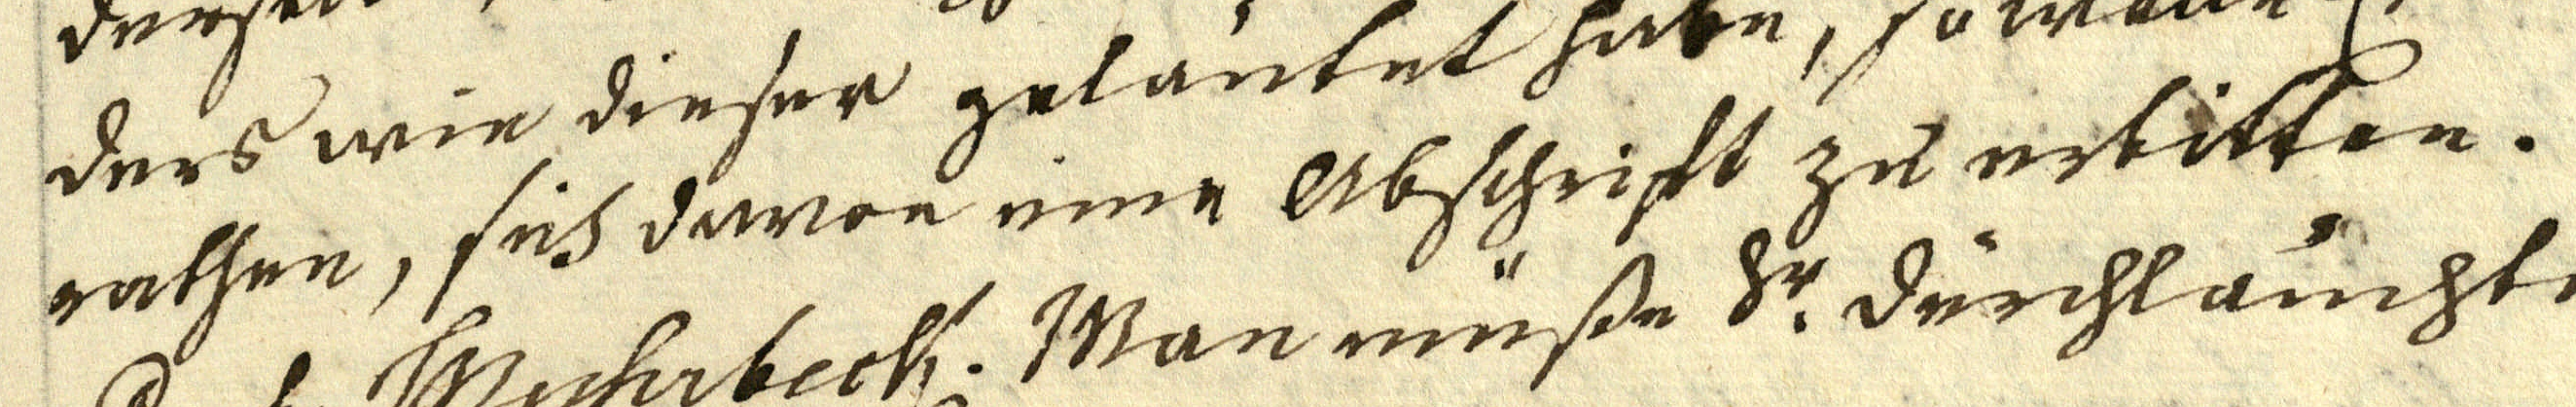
rathen, sich davon eine Abschrift zu erbitten.
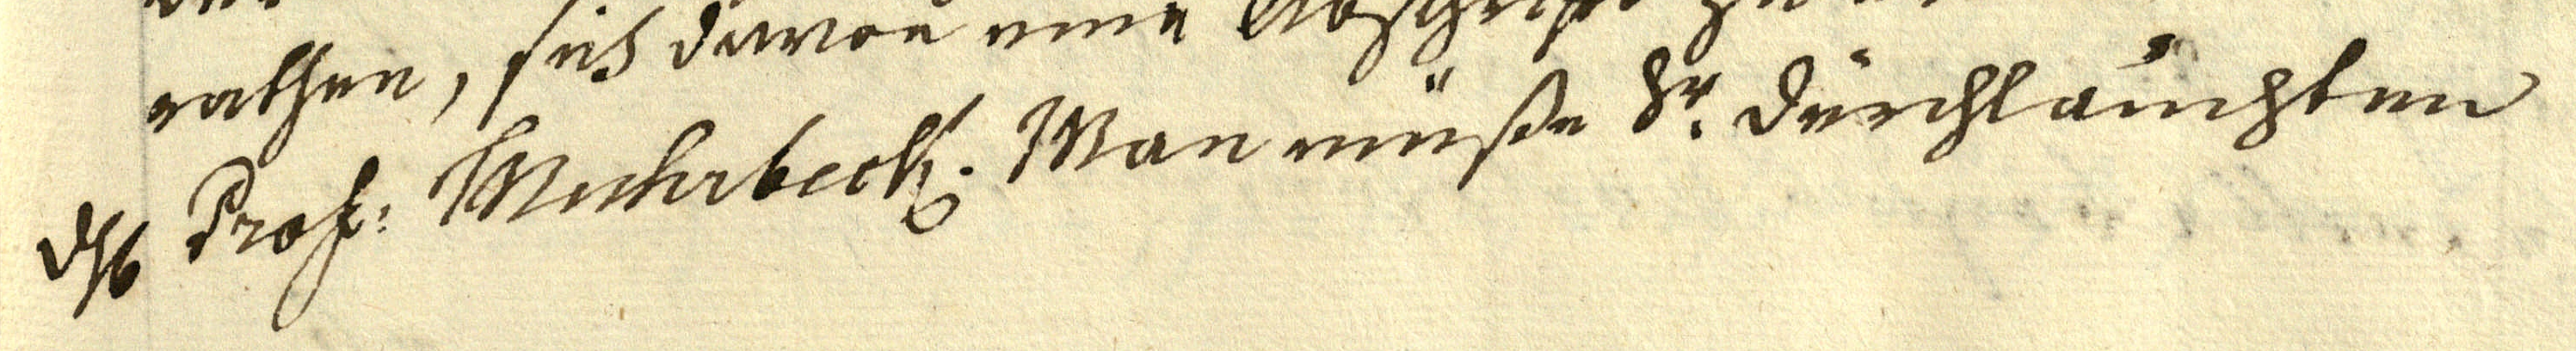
dh Prof. Muhrbeck. Man müße Sr Durchlauchten
